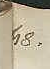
48.
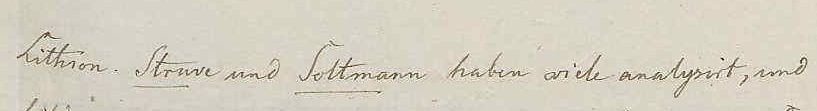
Lithion. Struve und Soltmann haben viele analysirt, und
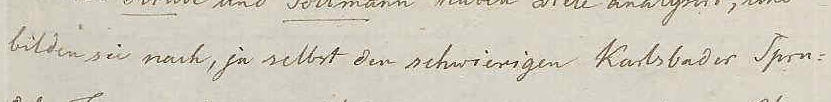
bilden sie nach, ja selbst den schwierigen Karlsbader Spru-
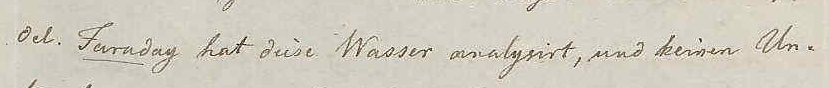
del. Faraday hat diese Wasser analysirt, und keinen Un-
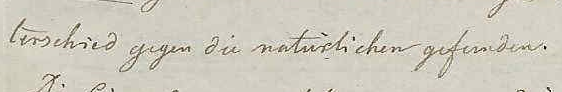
terschied gegen die natürlichen gefunden.
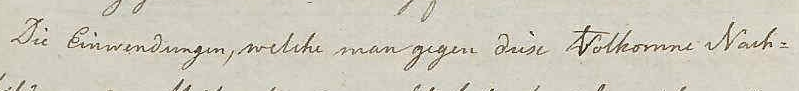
Die Einwendungen, welche man gegen diese Vvolkomne Nach-
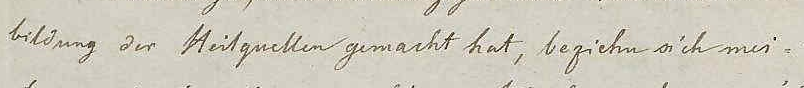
bildung der Heilquellen gemacht hat, beziehn sich mei-
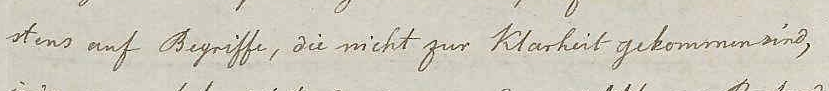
stens auf Begriffe, die nicht zur Klarheit gekommen sind,
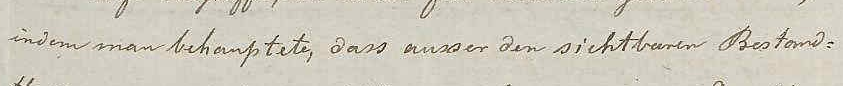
indem man behauptete, dass ausser den sichtbaren Bestand-
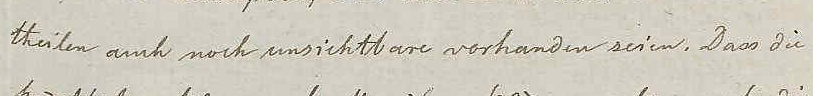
theilen auch noch unsichtbare vorhanden seien. Dass die
